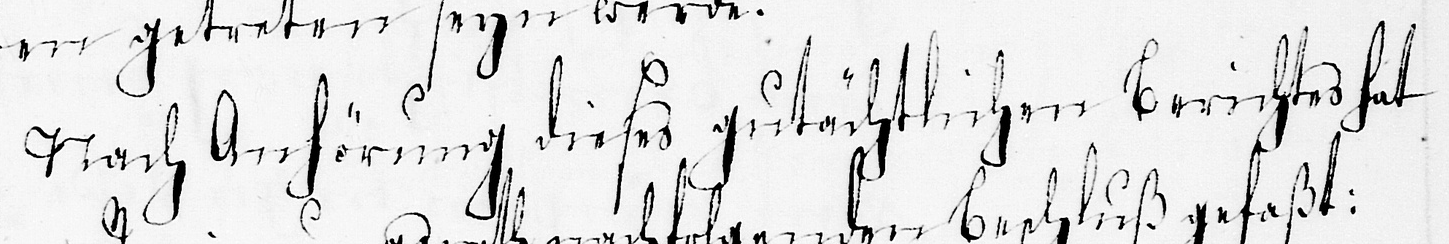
Nach Anhörung dieses gutächtlichen Berichtes hat
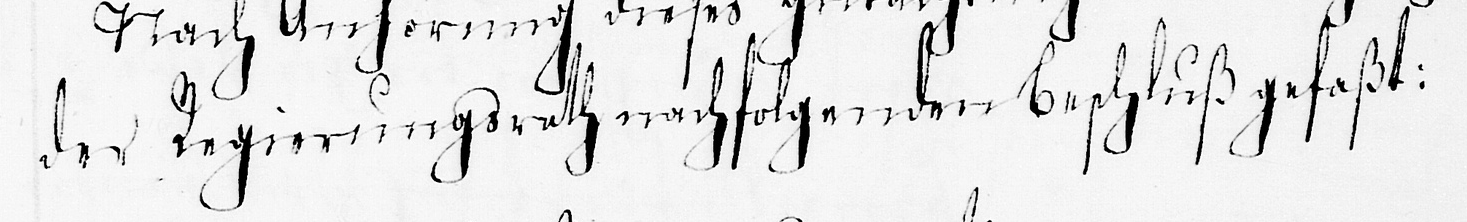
der Regierungsrath nachfolgenden Beschluß gefaßt:
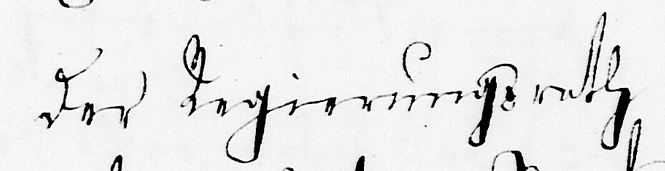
Der Regierungsrath
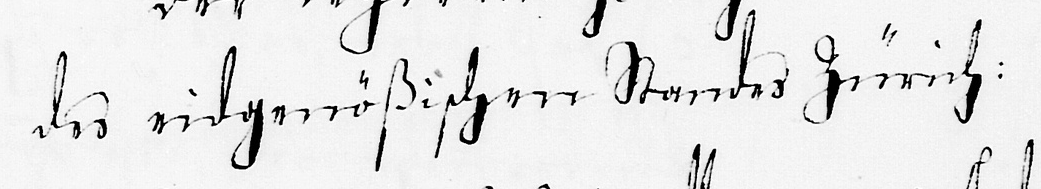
des eidgenößischen Standes Zürich:
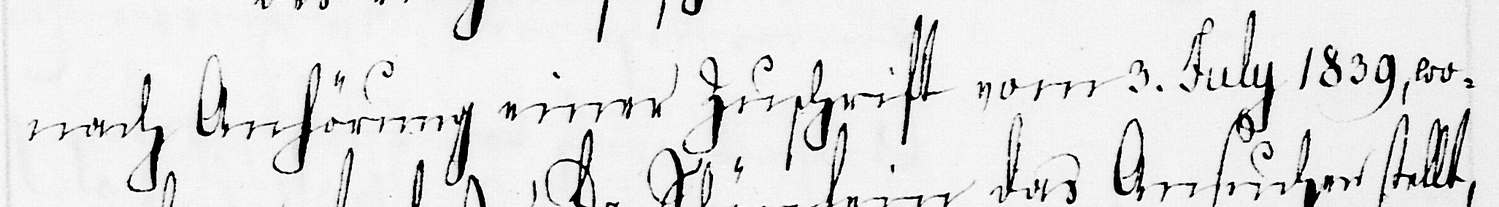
nach Anhörung einer Zuschrift vom 3. July 1839, wo¬
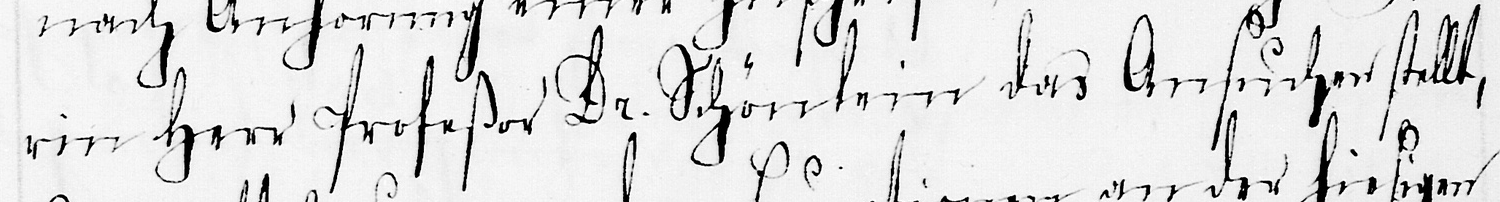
rin Herr Profeßor Dr. Schönlein das Ansuchen stel¬
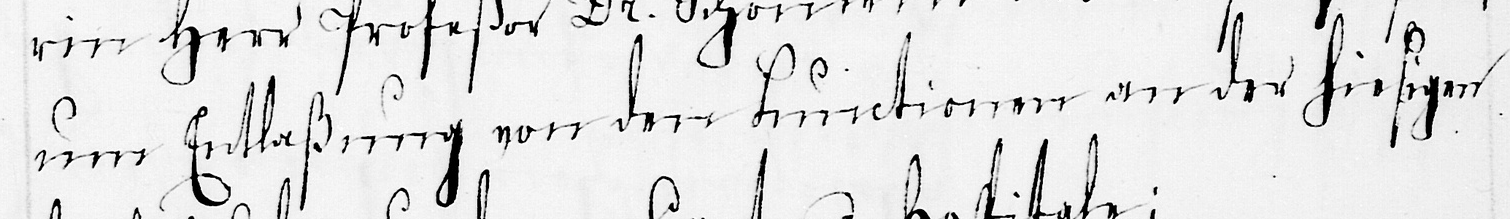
um Entlaßung von den Functionen an der hiesigen
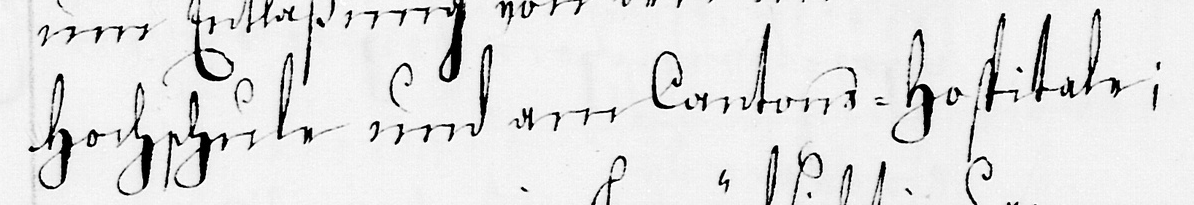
Hochschule und am Cantons-Hospitale;
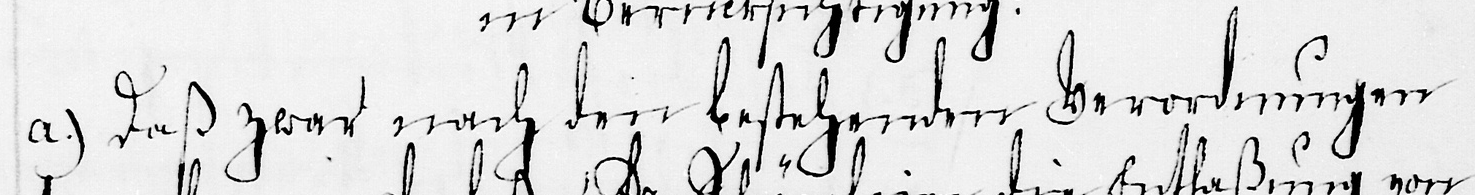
a.) Daß zwar nach den bestehenden Verordnungen
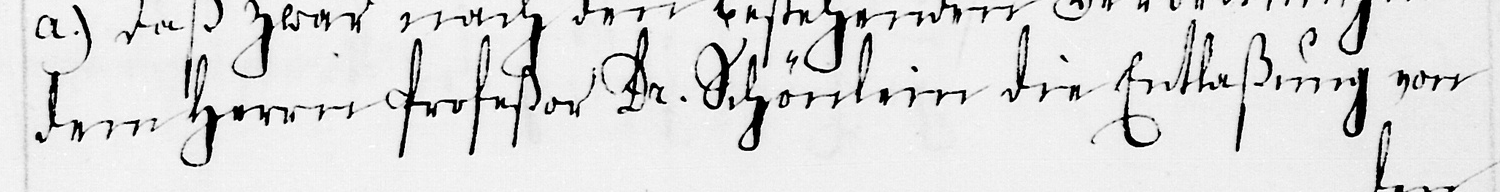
dem Herrn Profeßor Dr. Schönlein die Entlaßung von
